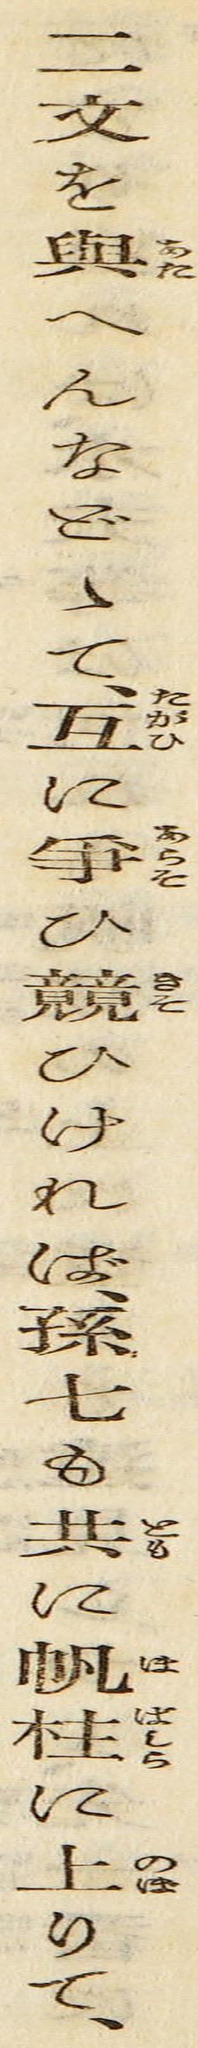二文を与へんなどゝて、互に争ひ競ひければ、孫七も共に帆柱に上りて、
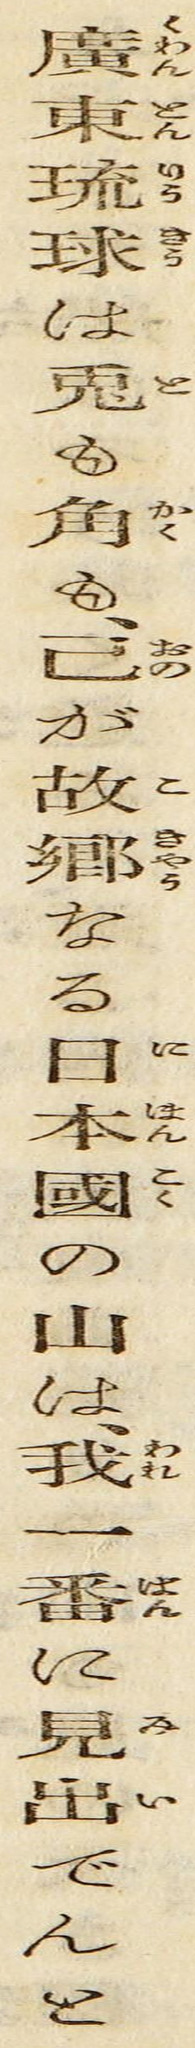広東琉球は兎も角も、己が故郷なる日本国の山は、我一番に見出でんと
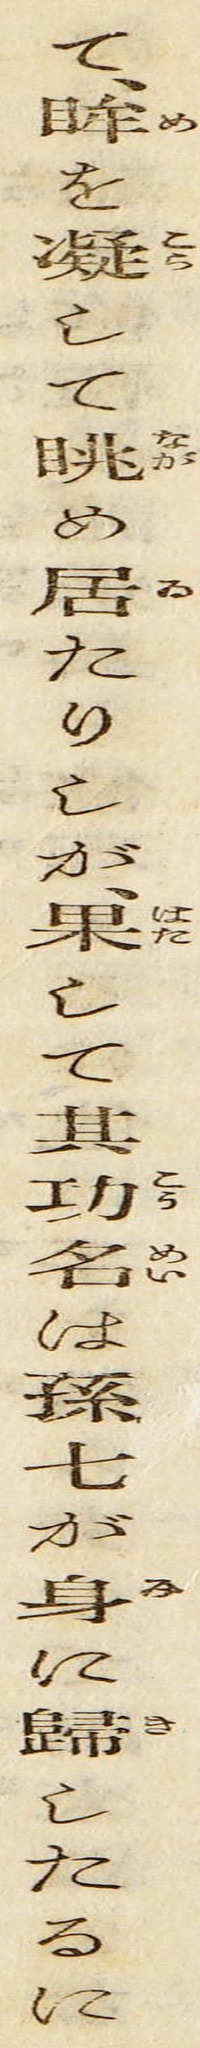て、眸を凝して眺め居たりしが、果して其功名は孫七が身に帰したるに
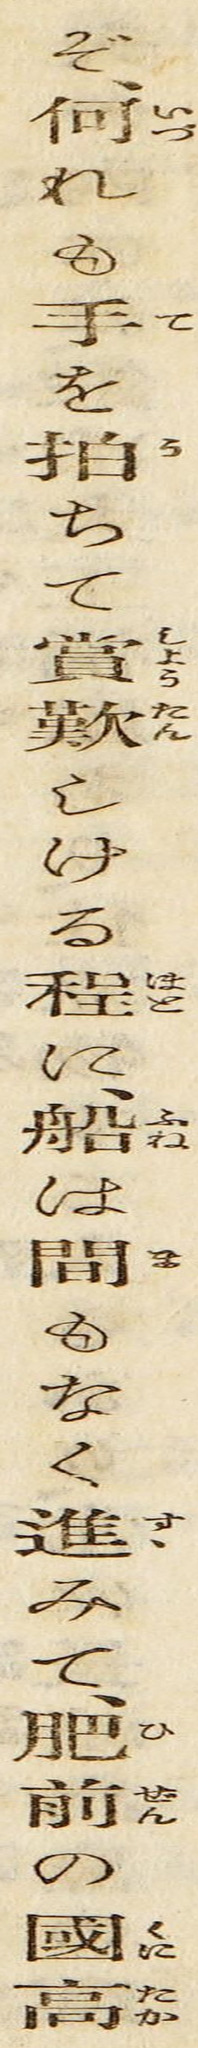ぞ、何れも手を拍ちて賞歎しける程に、船は間もなく進みて、肥前の国高
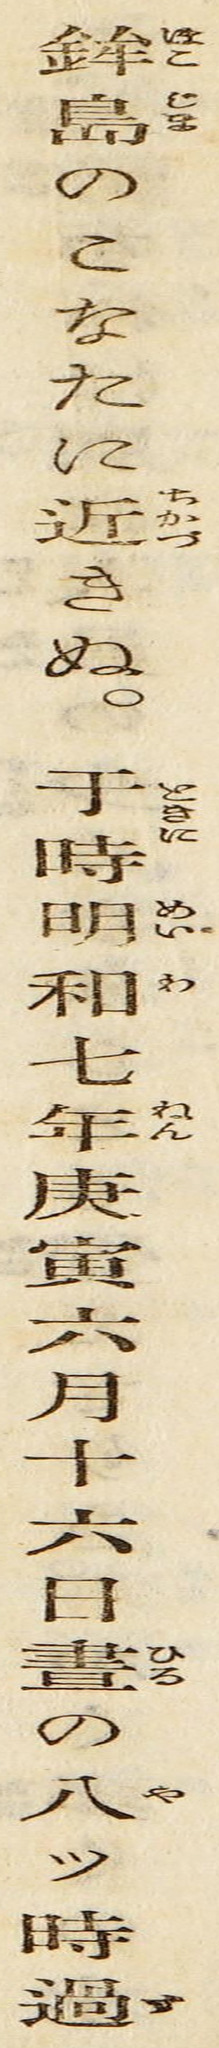鉾島のこなたに近きぬ。于時明和七年庚寅六月十六日昼の八ツ時過
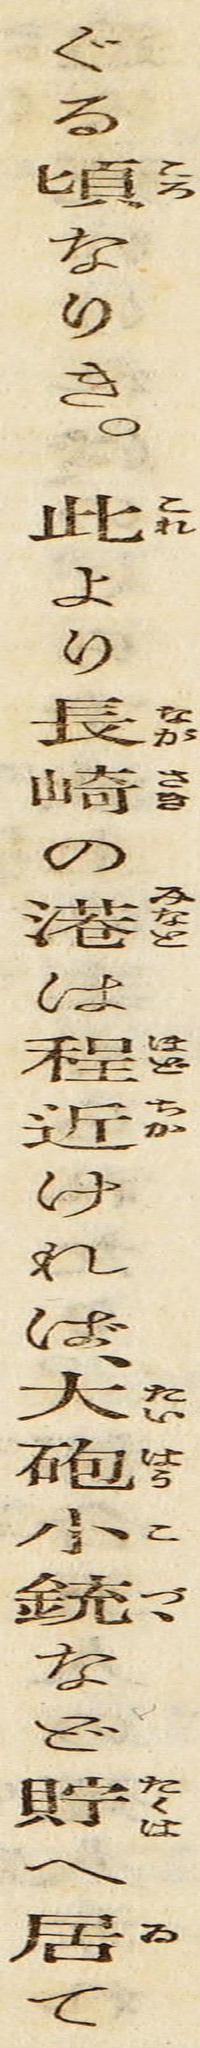ぐる頃なりき。此より長崎の港は程近ければ、大砲小銃など貯へ居て
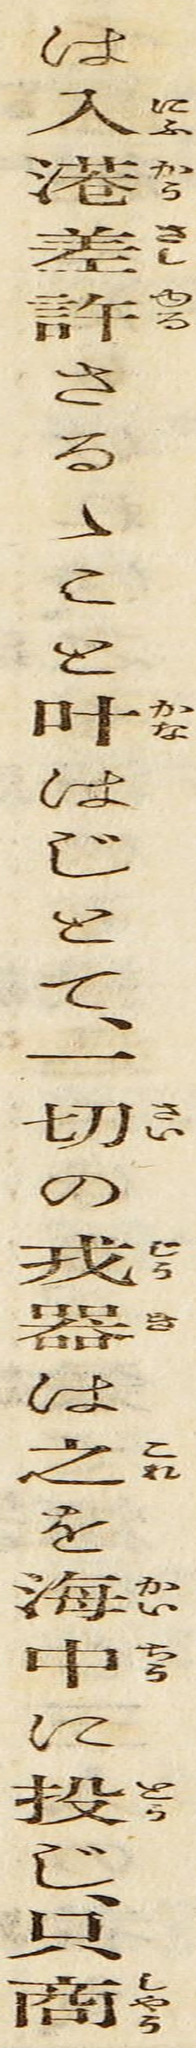は入港差許さるゝこと叶はじとて、一切の戎器は之を海中に投じ、只商
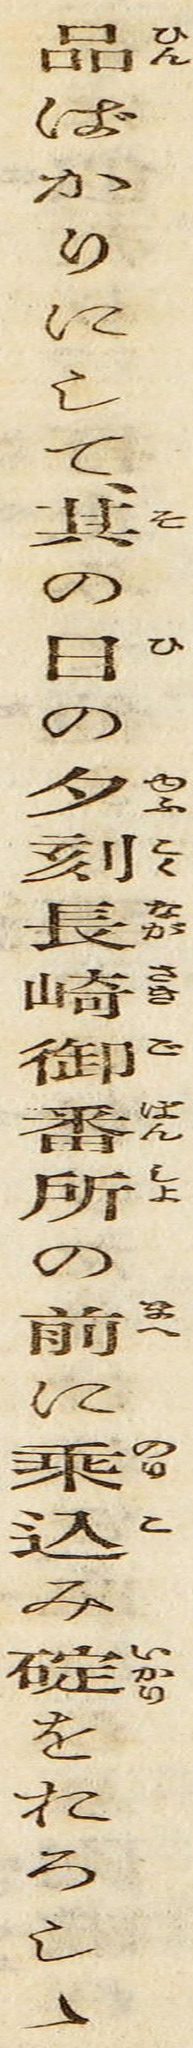品ばかりにして、其の日の夕刻長崎御番所の前に乗込み碇をおろしゝ
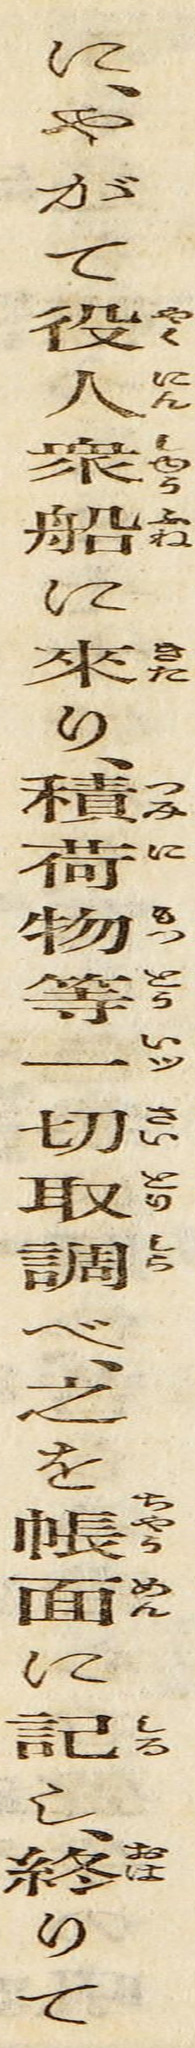に、やがて役人衆船に来り、積荷物等一切取調べ、之を帳面に記し、終りて
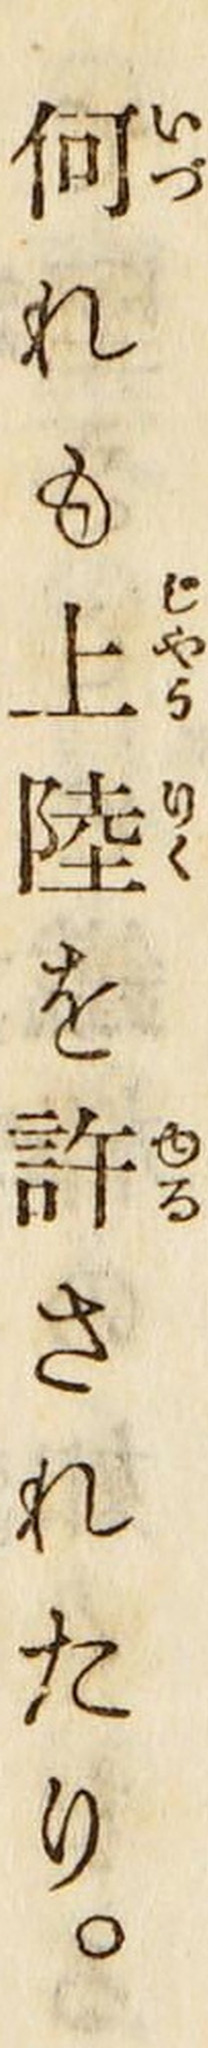何れも上陸を許されたり。
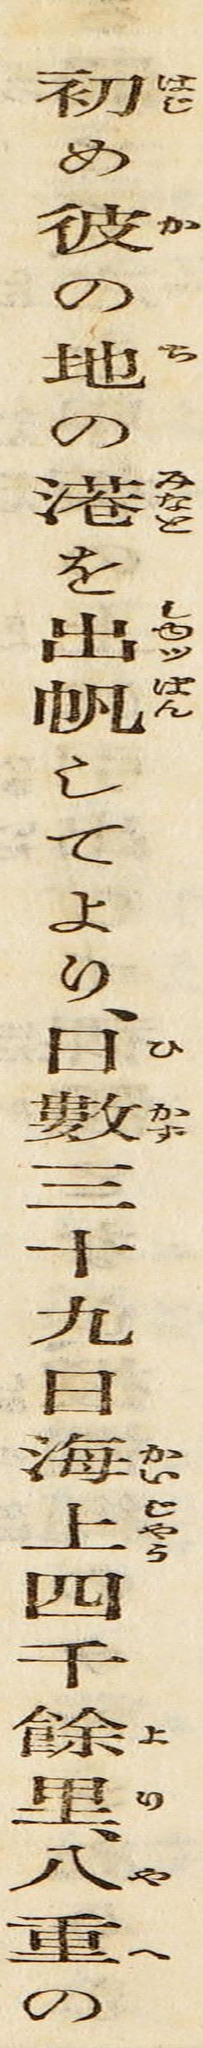初め彼の地の港を出帆してより、日数三十九日海上四千余里、八重の
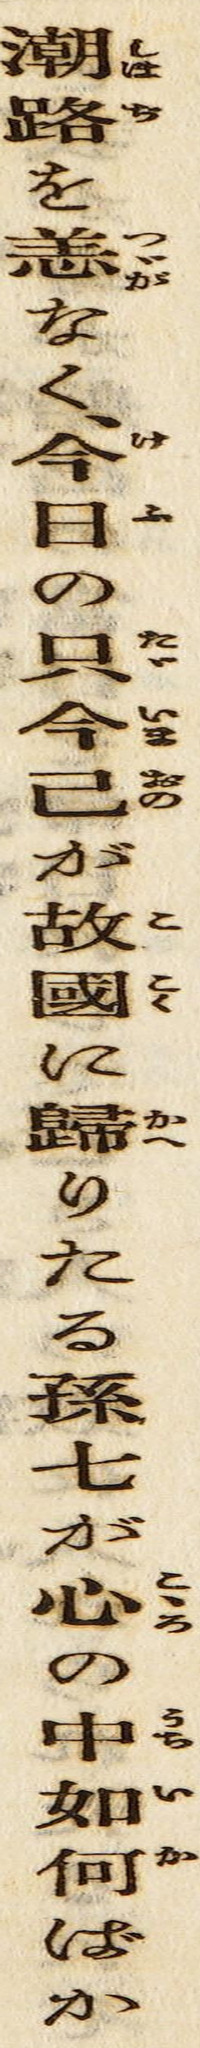潮路を恙なく、今日の只今己が故国に帰りたる孫七が心の中如何ばか
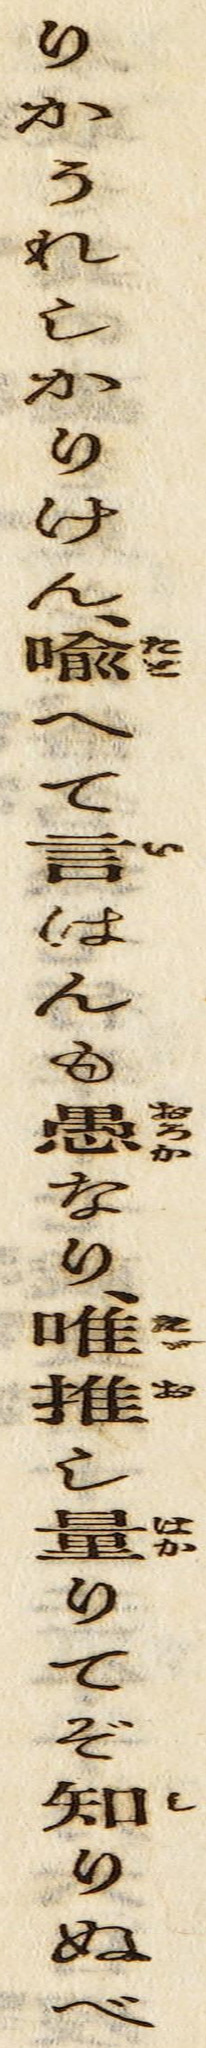りかうれしかりけん、喩へて言はんも愚なり、唯推し量りてぞ知りぬべ
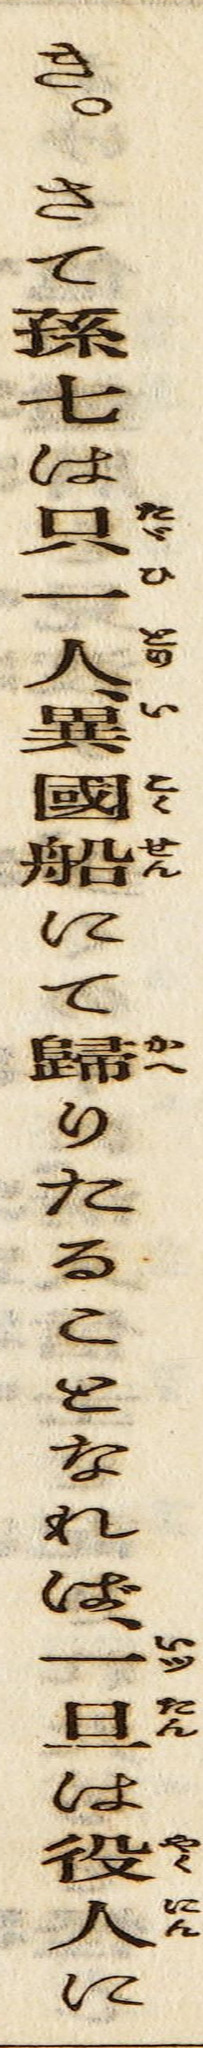き。さて孫七は只一人、異国船にて帰りたることなれば、一旦は役人に
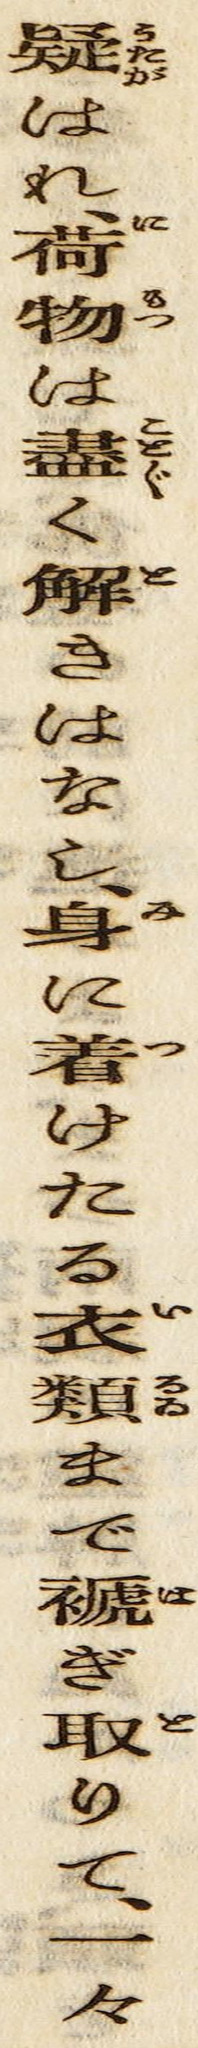疑はれ、荷物は尽く解きはなし、身に着けたる衣類まで褫ぎ取りて、一々
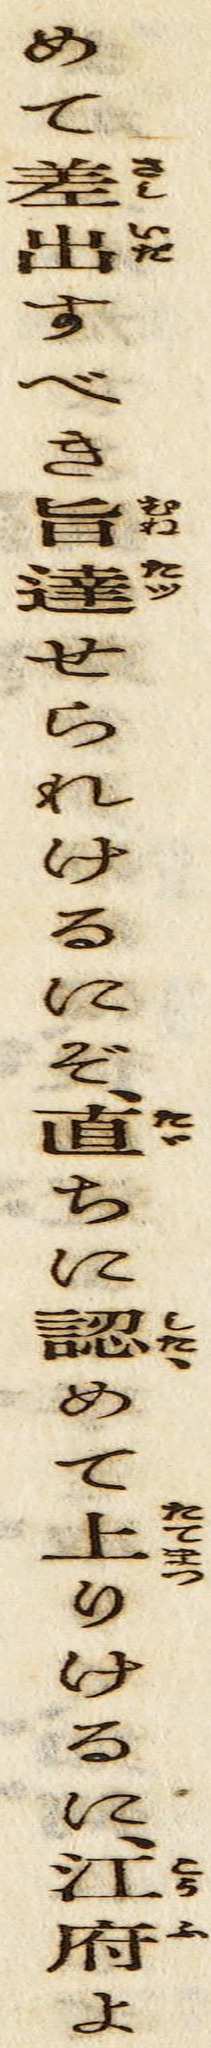めて差出すべき旨達せられけるにぞ、直ちに認めて上りけるに、江府よ
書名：日本漂流譚
